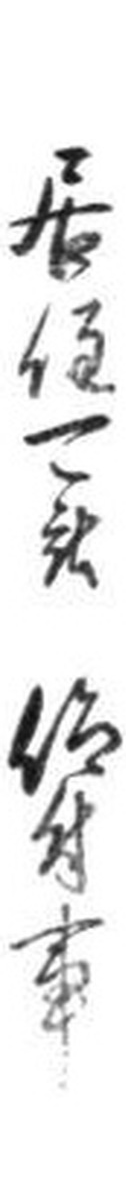居住可被仰付事
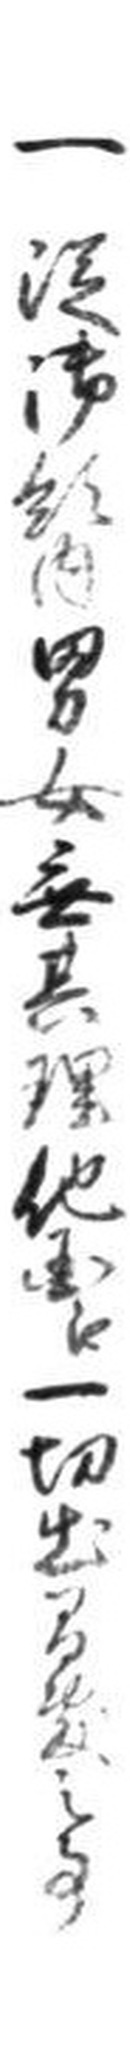一従御領内男女無其理他国江一切出間敷之事
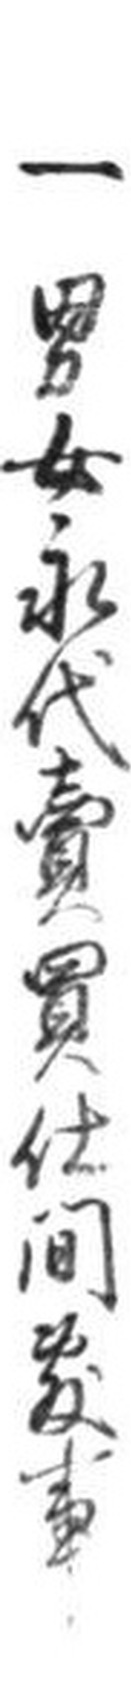一男女永代売買仕間敷事
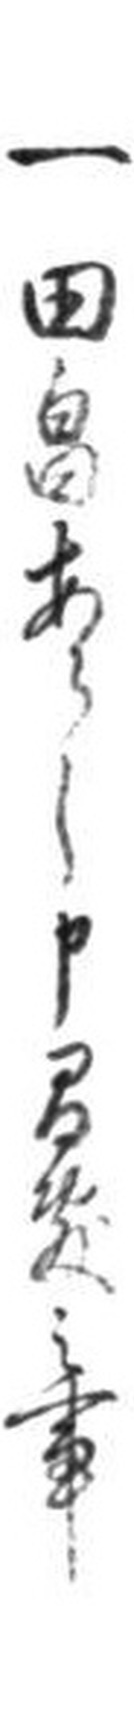一田畠あらし申間敷之事
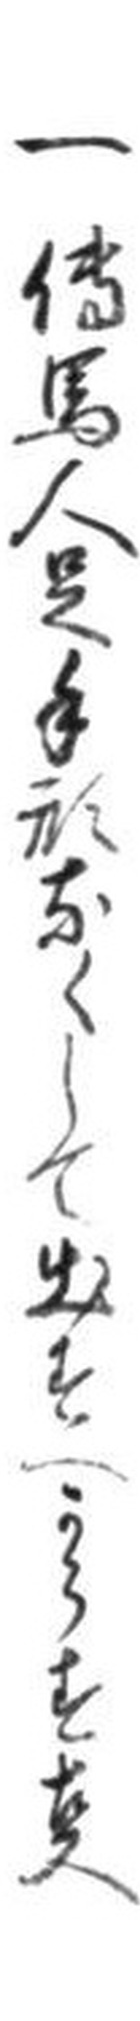一伝馬人足手形なくして出すへからす事
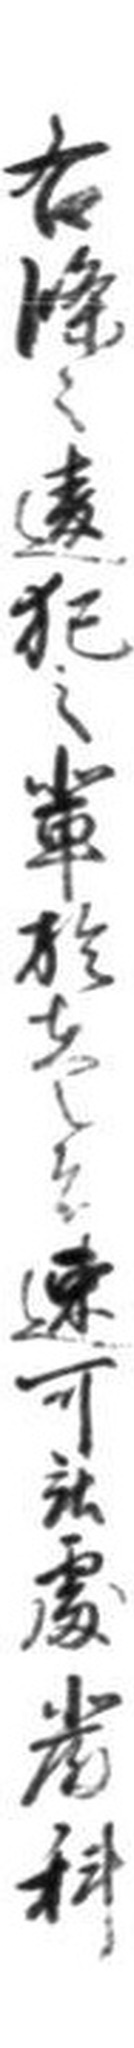右条々違犯之輩於在之者速可被処厳科
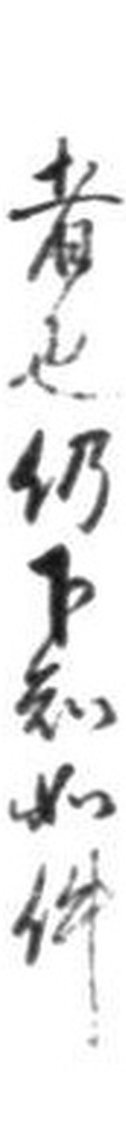者也仍下知如件
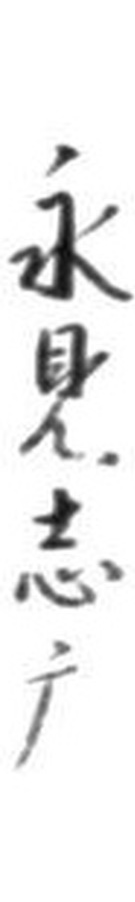永見志摩
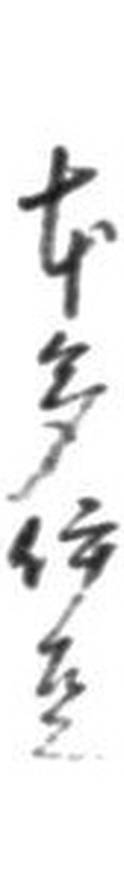本多伊豆
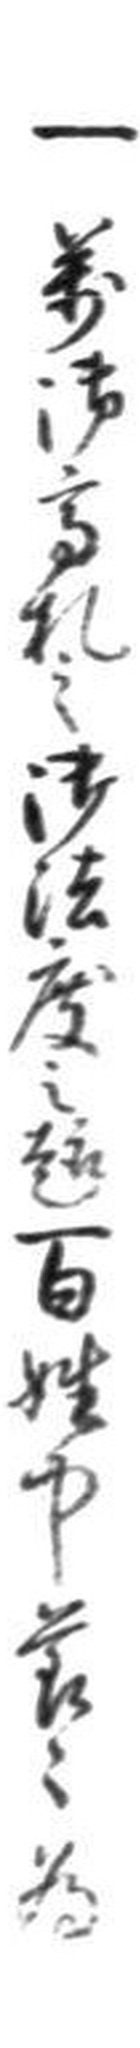一萬御高札之御法度之趣百姓中節々為
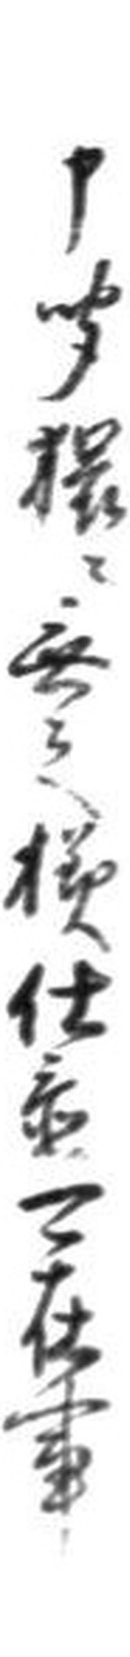申聞猥ニ無之様仕置可在事
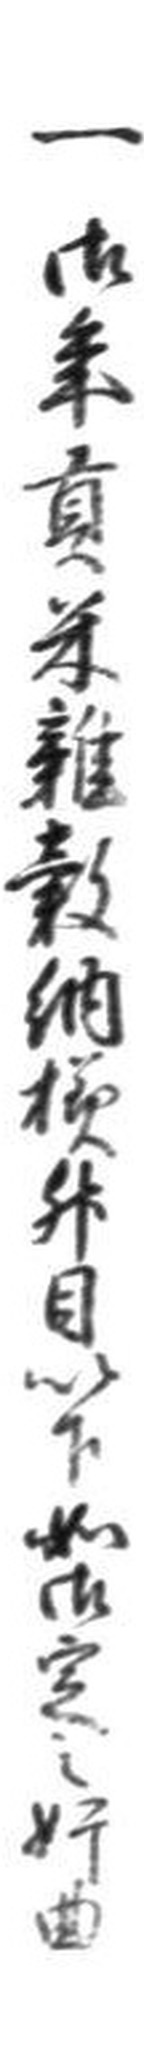一御年貢米雑穀納様升目以下如御定之奸曲
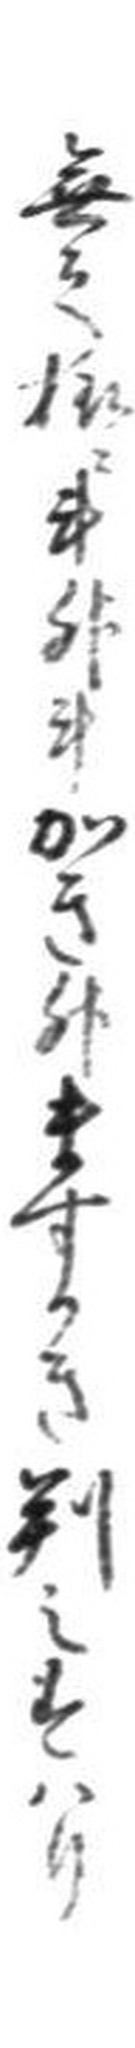無之様ニ斗升斗かき升ますかき判之すはり

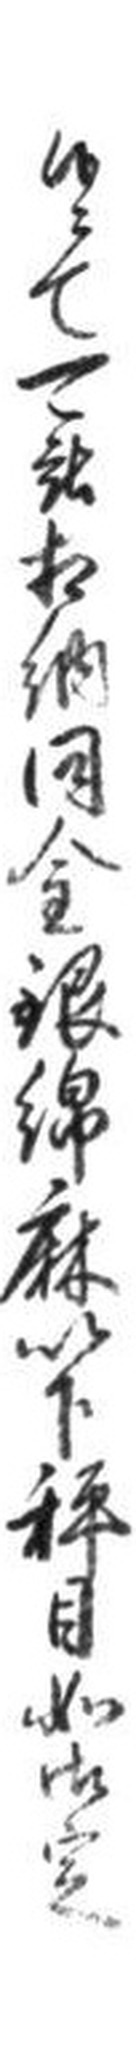候ニて可被相納同金銀綿麻以下秤目如御定
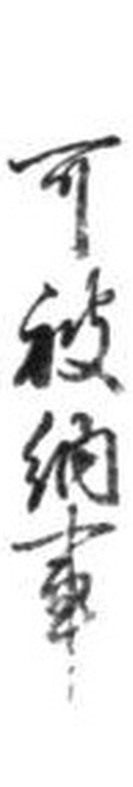可被納事
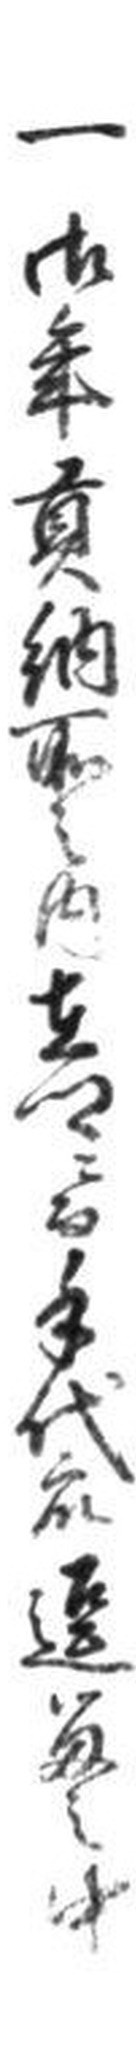一御年貢納所之内在郷ニ而手代衆逗留之中
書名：家譜 三 忠昌公 従慶長八年到寛永六年
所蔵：福井県文書館 Fukui Prefectural Archives
